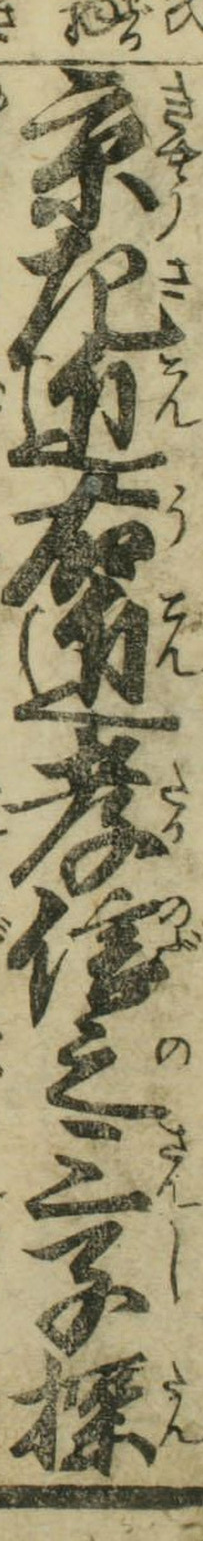京左近右近孝信之三子探
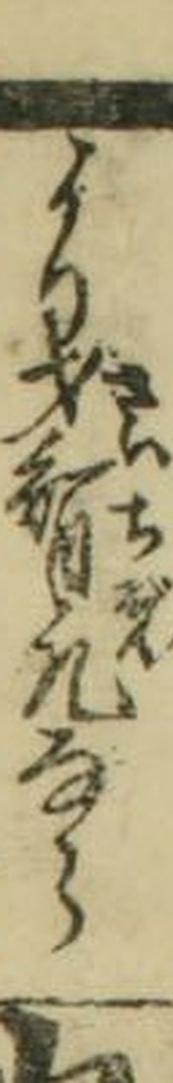より才智凢なら
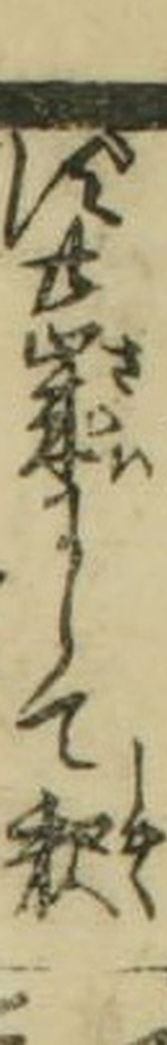ず廿歳にして釈
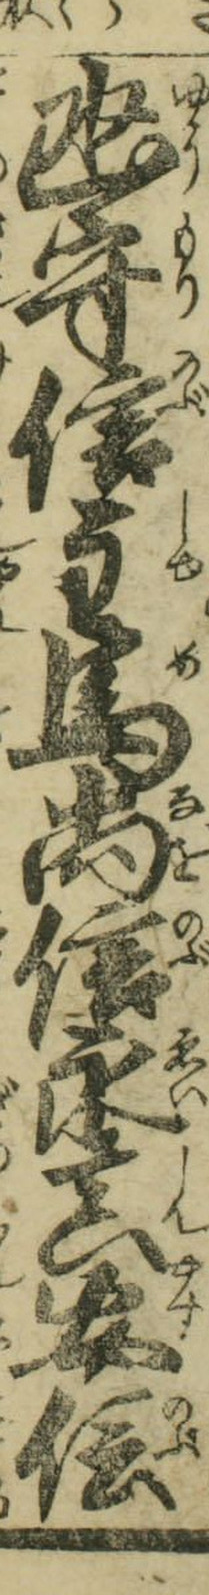幽守信主馬尚信永真安信
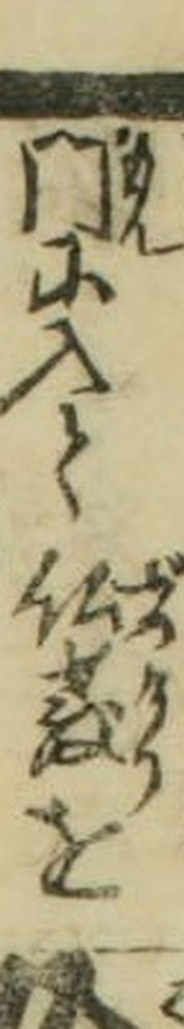門に入て仏教を
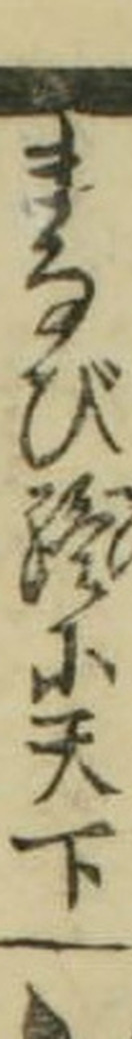まなび終に天下
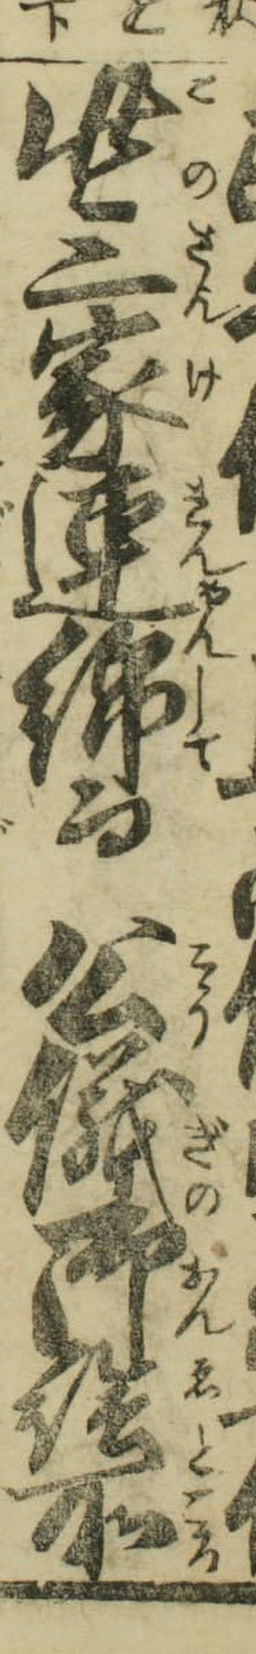此三家連綿而公儀御繪所
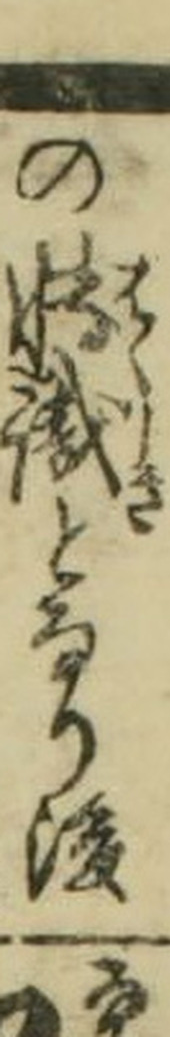の博識となり後
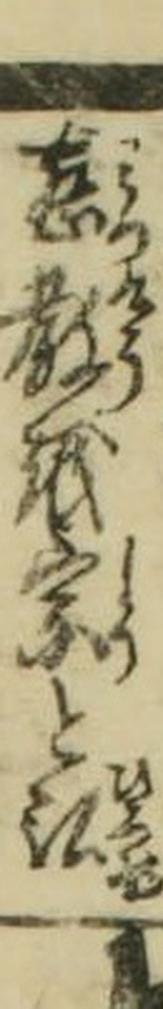密教を宗と弘
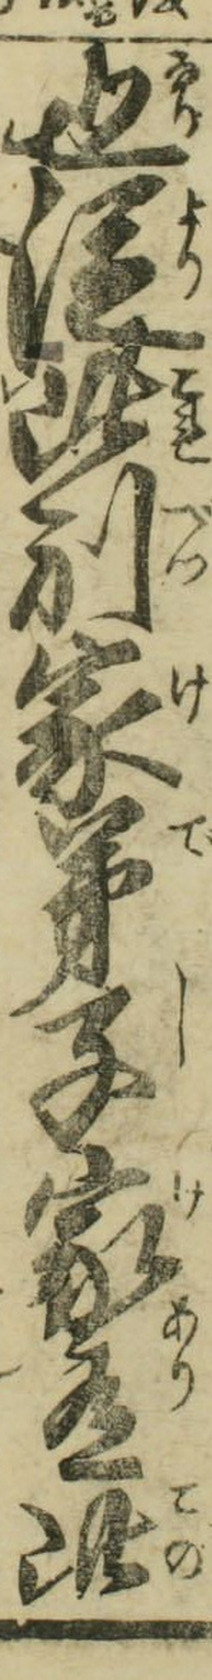也従此別家弟子家有此
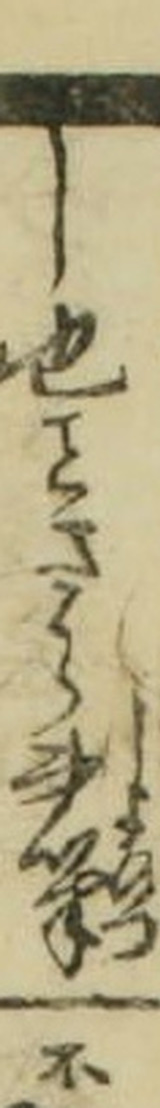し也ことさら書筆
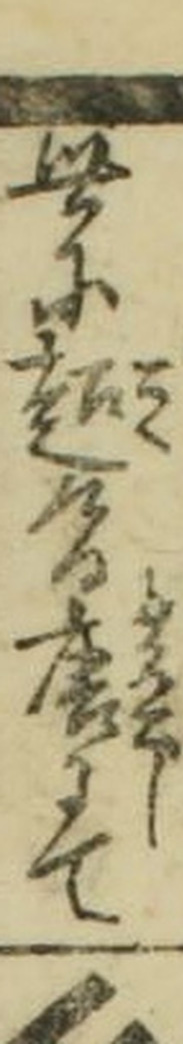世に越けり唐にて
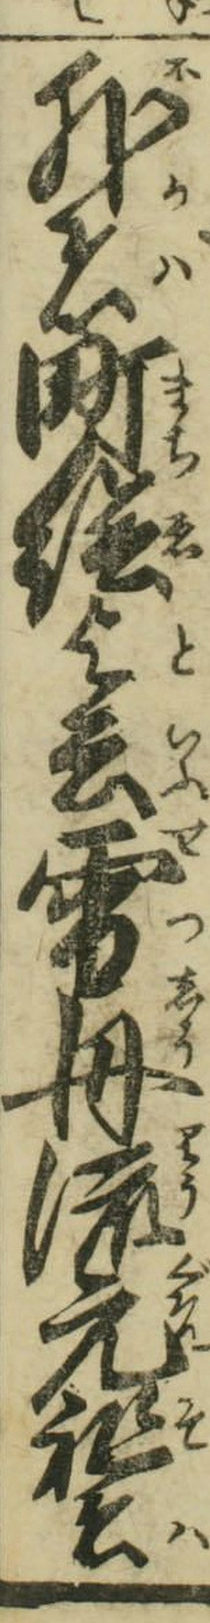外者町絵与云雪舟流元祖者
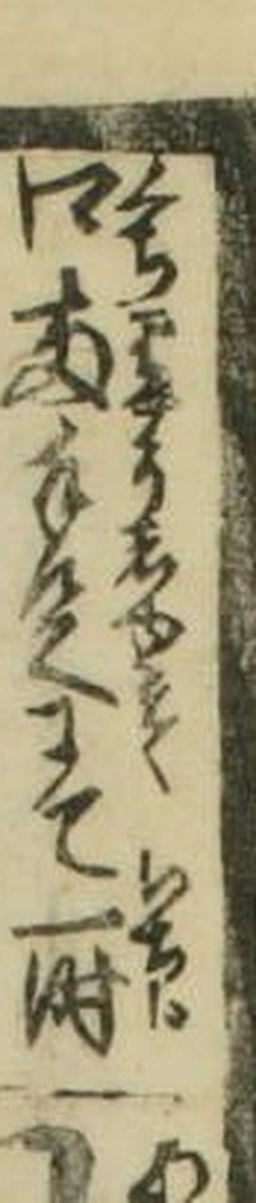口両手足にて一時
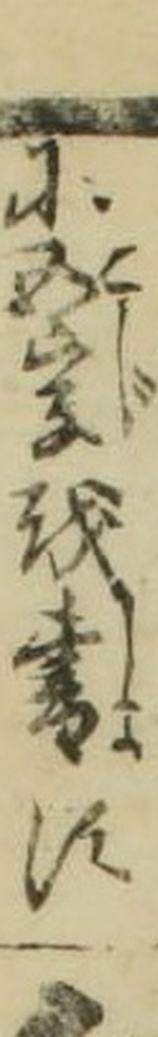に五字を書す
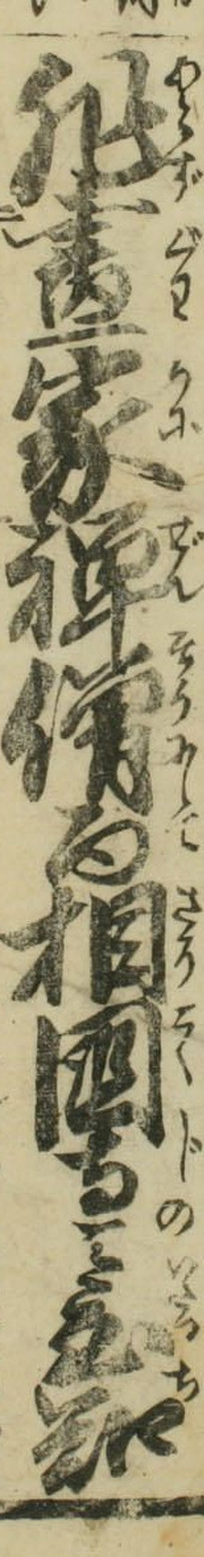非畫家禅僧而相国寺之至知
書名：増補職人往来
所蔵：東京学芸大学教育コンテンツアーカイブ
